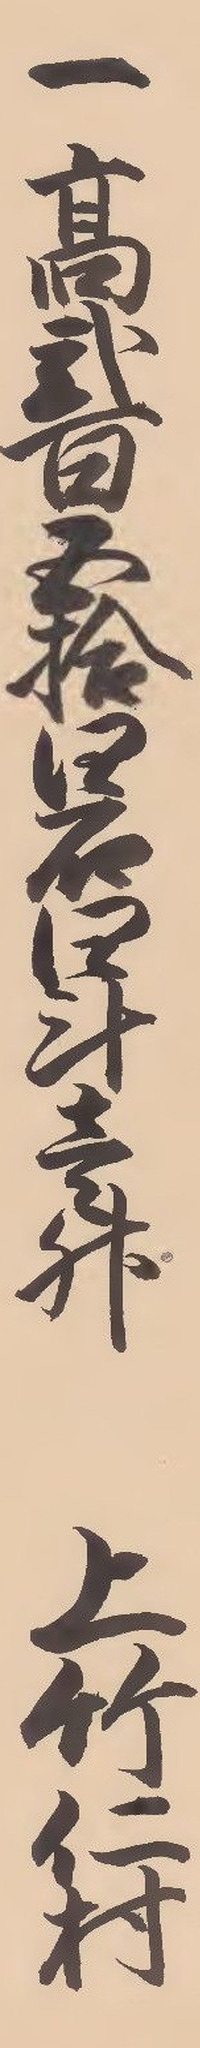一高弐百五拾四石四斗壱升上竹仁村

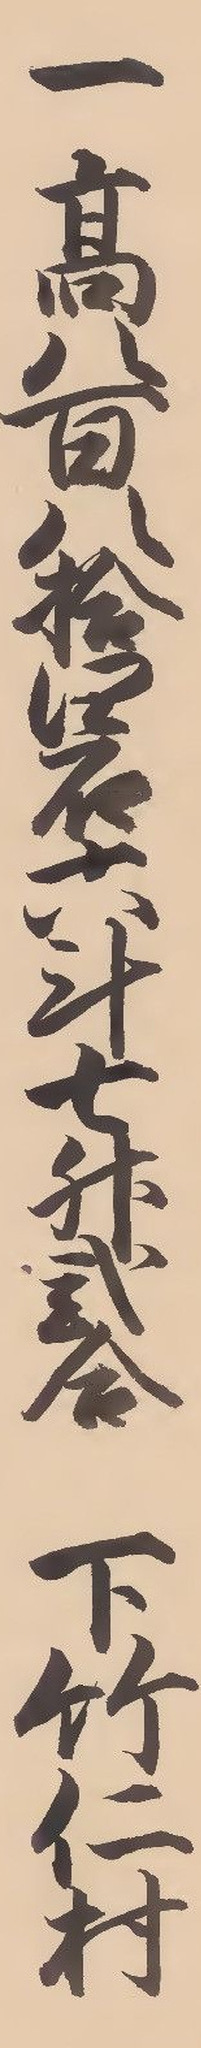一高八百八拾四石六斗七升弐合下竹仁村
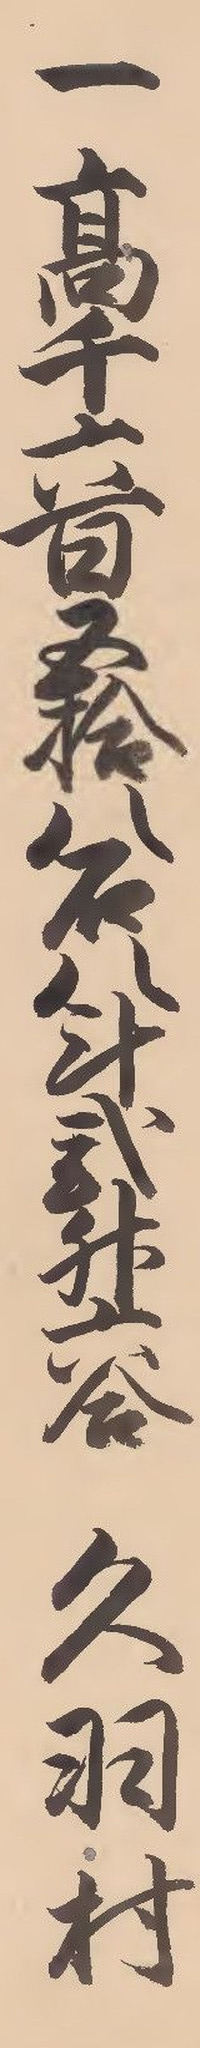一高千六百五拾八石八斗弐升六合久羽村
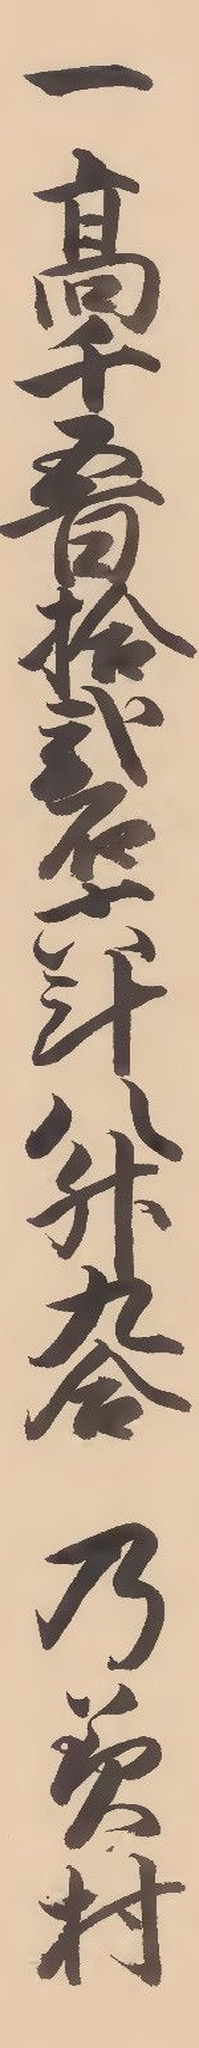一高千五百拾弐石六斗八升九合乃美村
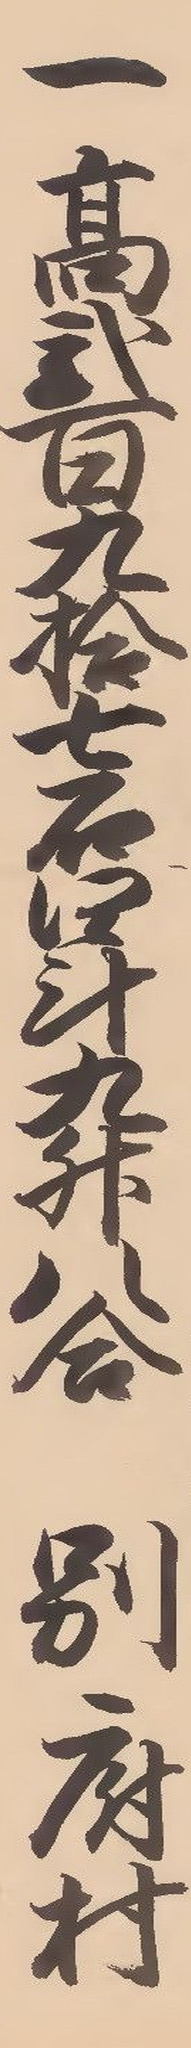一高弐百九拾七石四斗九升八合別府村
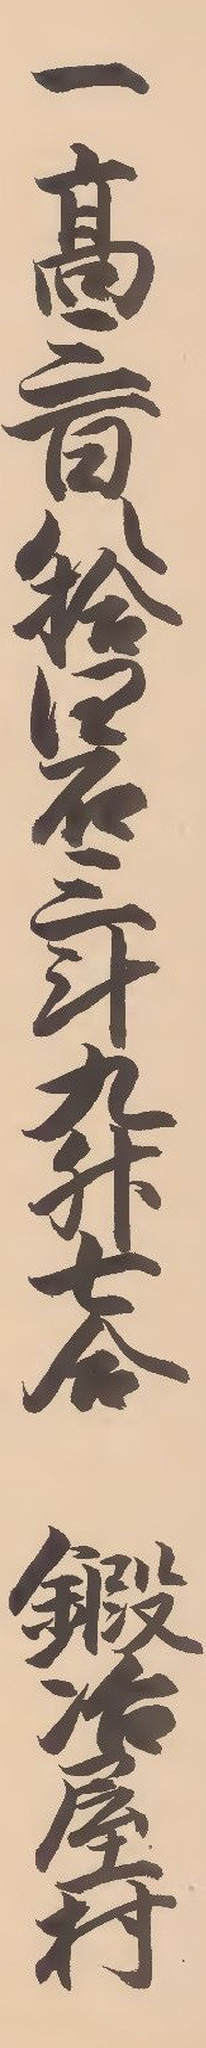一高三百八拾四石三斗九升七合鍛冶屋村
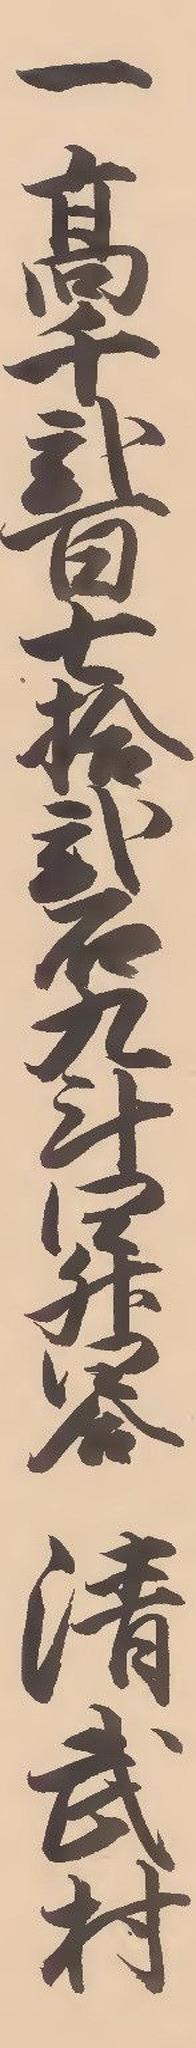一高千弐百七拾弐石九斗四升四合清武村
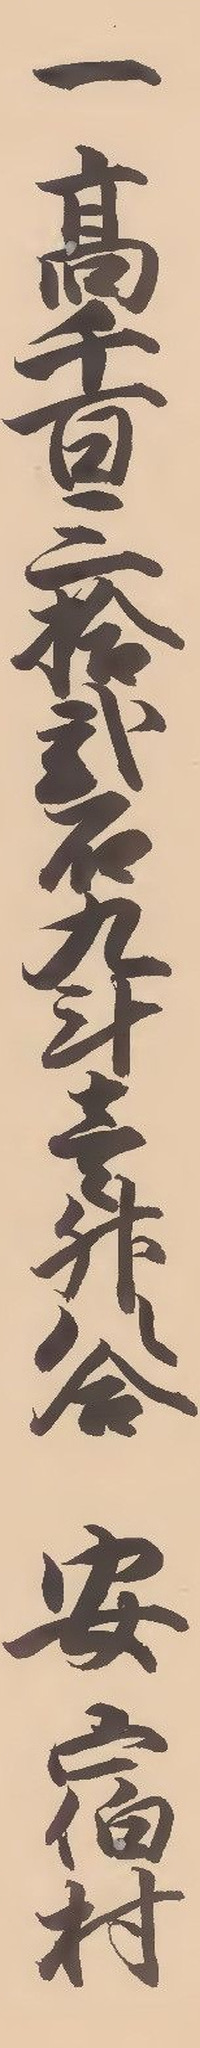一高千百三拾弐石九斗壱升八合安宿村
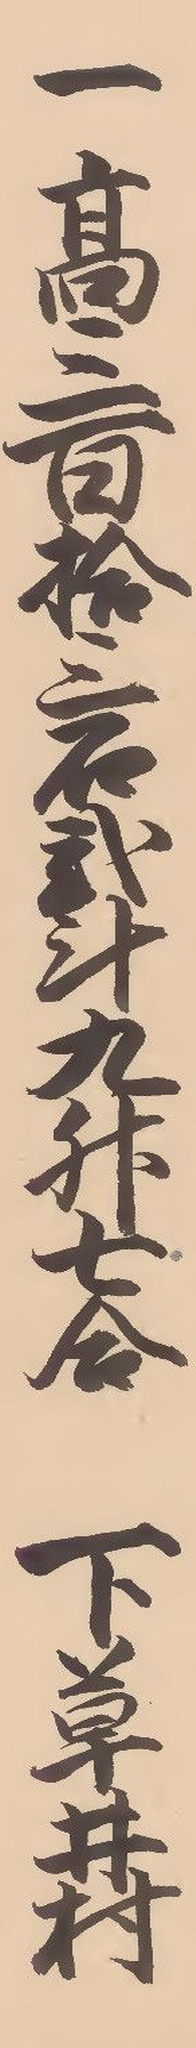一高三百拾三石弐斗九升七合下草井村

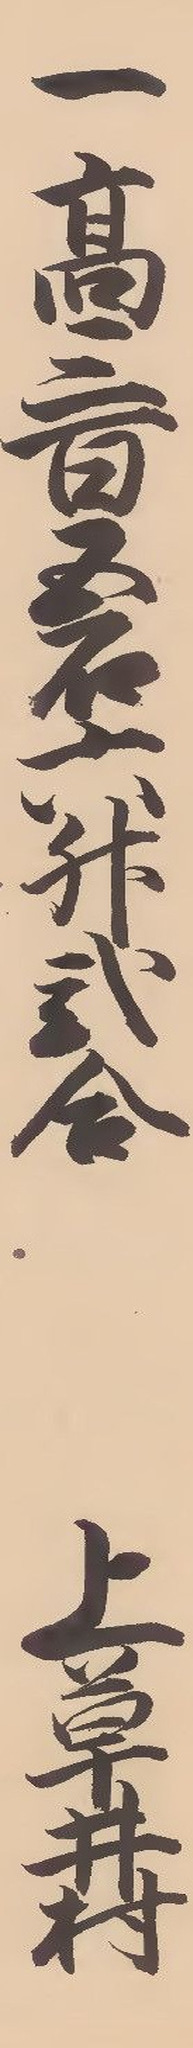一高三百五石六升弐合上草井村
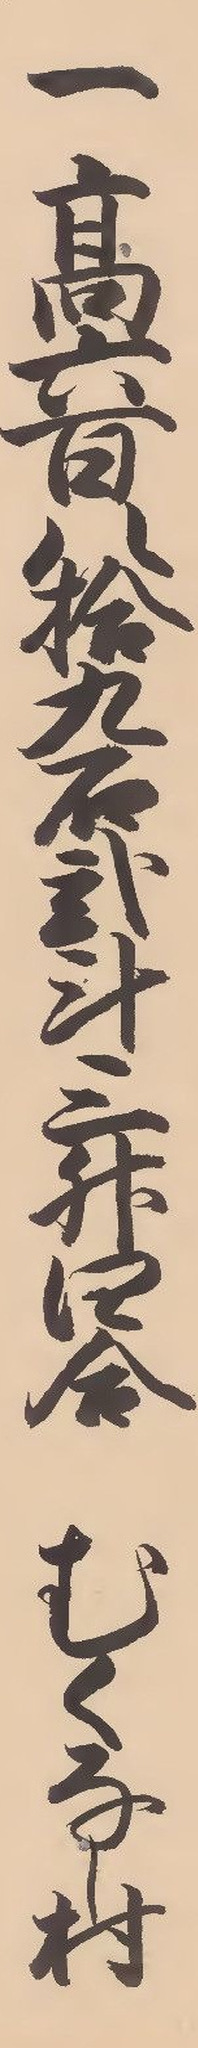一高六百八拾九石弐斗三升四合むくなし村
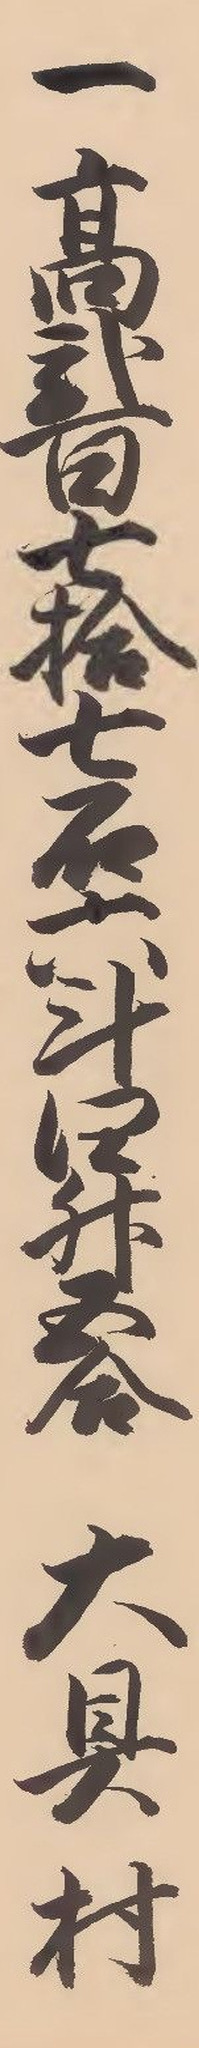一高弐百七拾七石六斗四升五合大具村
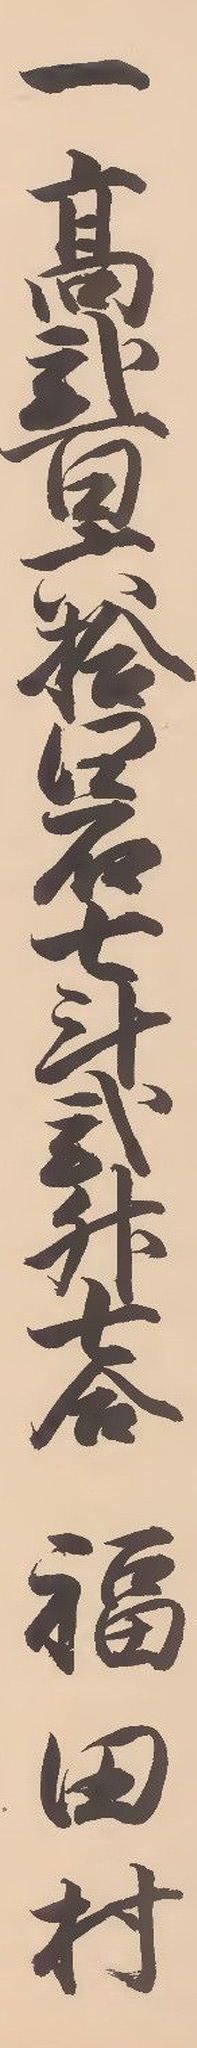一高弐百六拾四石七斗弐升七合福田村
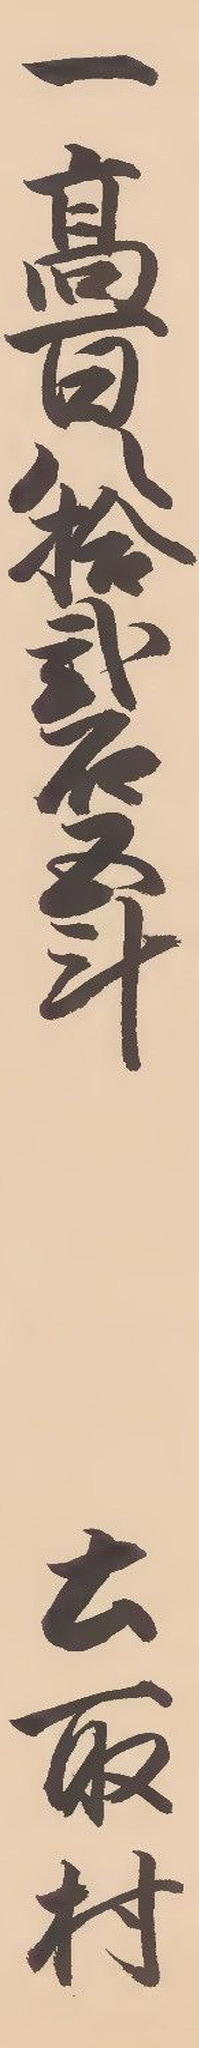一高百八拾弐石五斗土取村
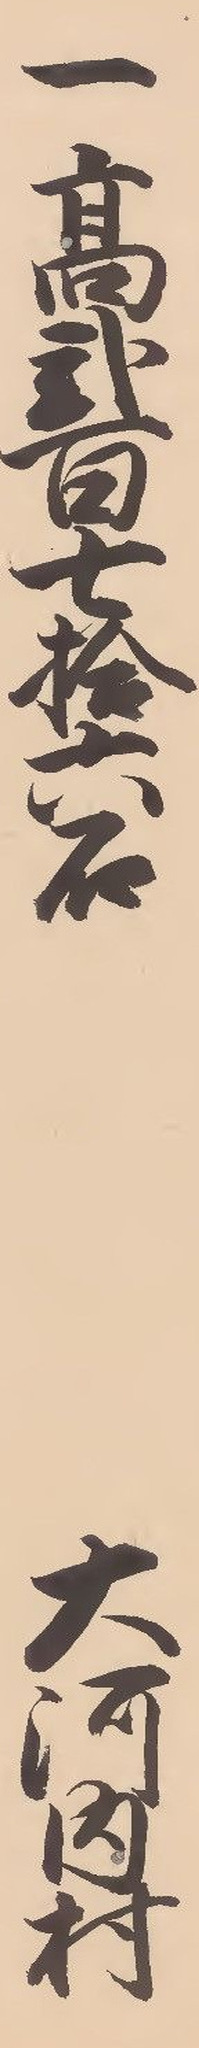一高弐百七拾六石大河内村
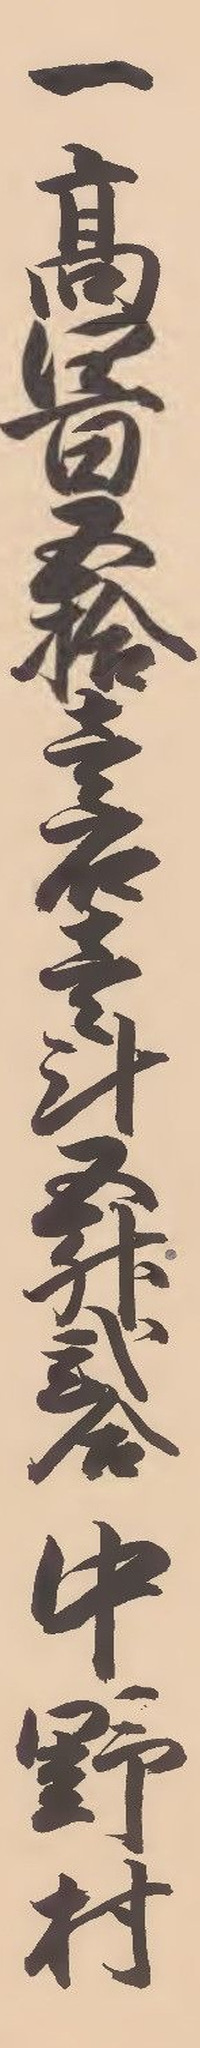一高四百五拾壱石壱斗五升弐合中野村
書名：安芸国郷帳
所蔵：国立公文書館 National Archives of Japan
